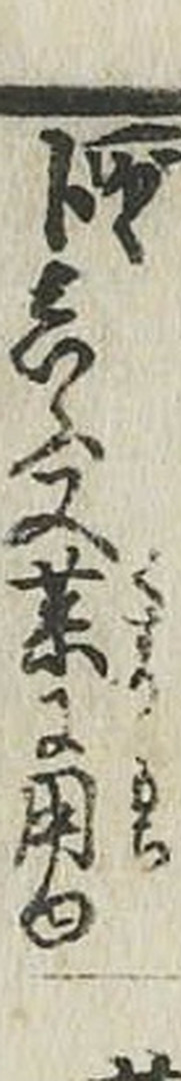卜といふ又薬に用ゆ
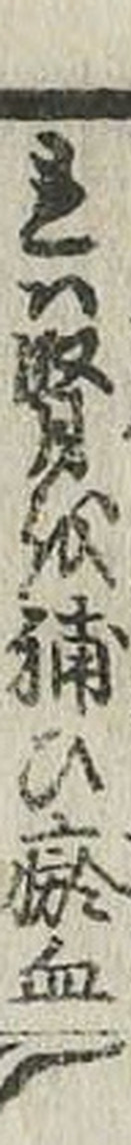れは腎を補ひ瘀血
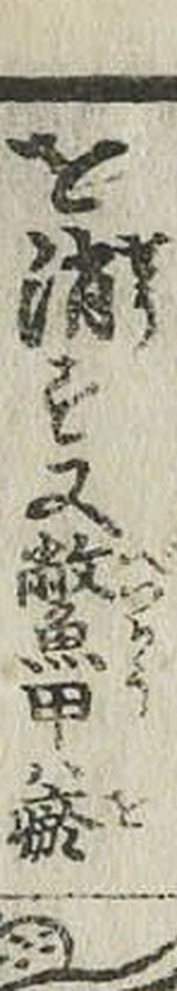を消す又鱉甲は瘀
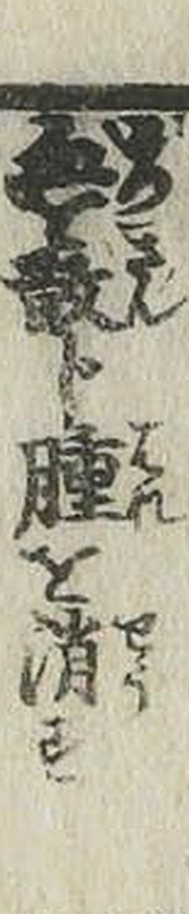血を散じ腫を消す

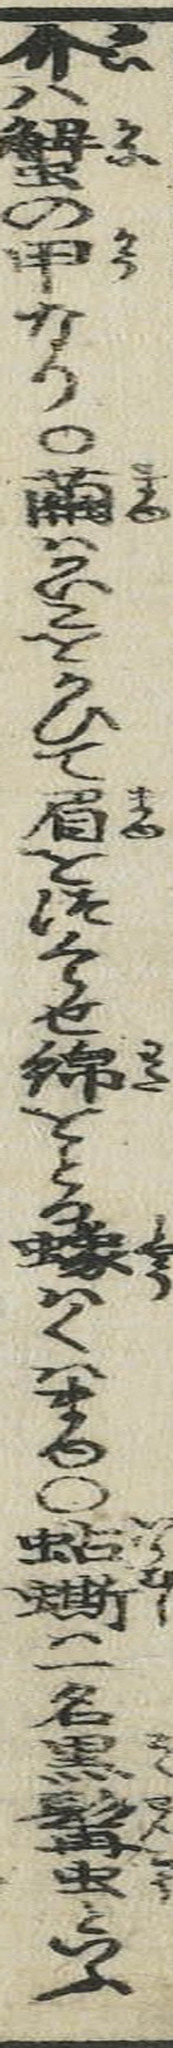介は蟹の甲なり○繭はかいこをかひて眉をつくらせ綿をとる蟓はくはまゆ○蛅蟖は一名黒髯虫といふ
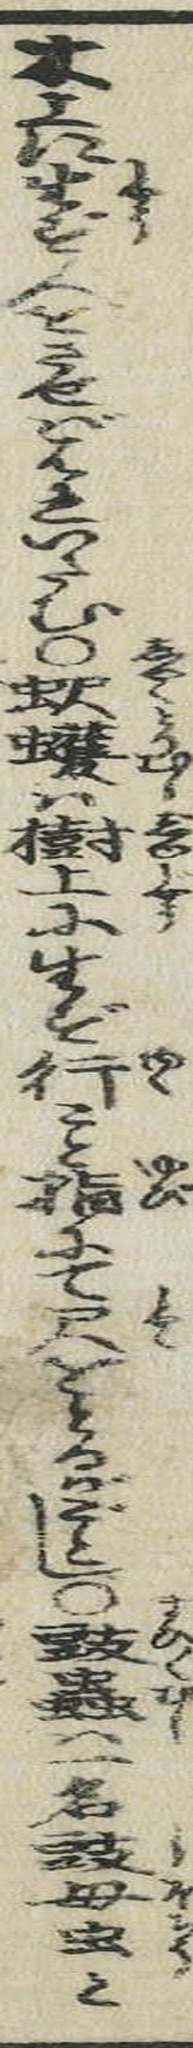木上に生ず人をさせばはれいたむ○蚇蠖は樹上に生ず行こと指にて尺をとるがごとし○豉虫は一名豉母虫と
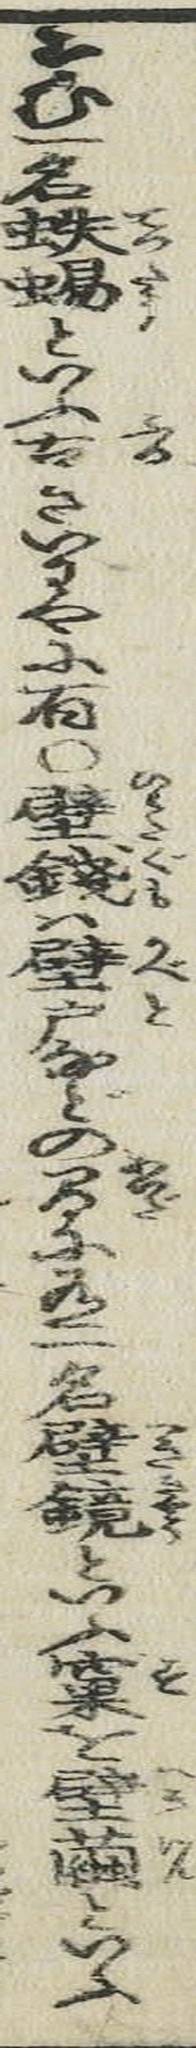すむ一名蛈蝪といふ古きいわやに有○壁銭は壁戸などの間に有一名壁鏡といふ巣を壁繭といふ
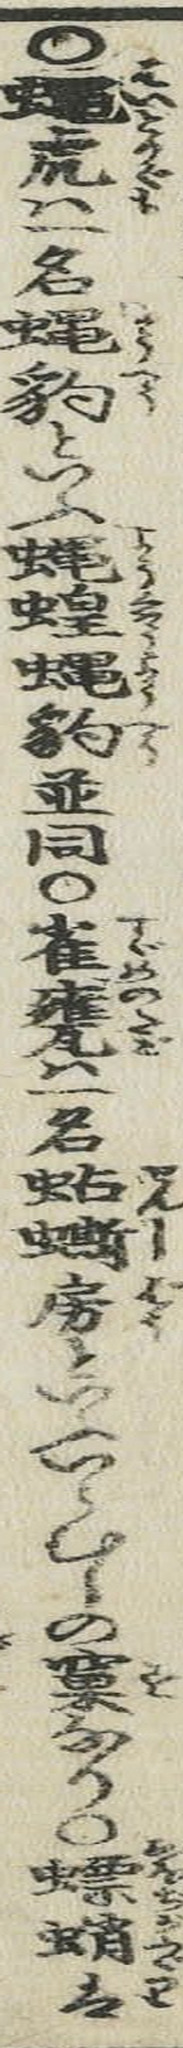○蝿虎は一名蝿豹といふ蝿蝗蝿豹並同○雀甕は一名蛅蟖房といふいらむしの巣なり○螵蛸は
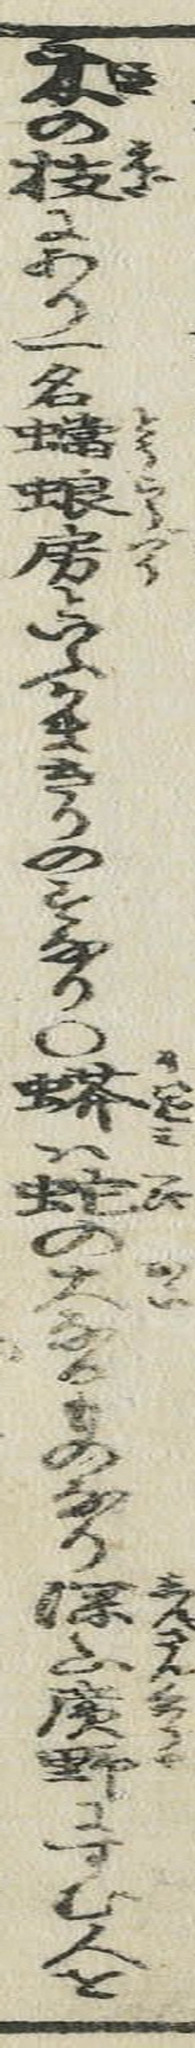木の枝にあり一名螳螂房といふかまきりのすなり○蠎は蛇の大なるものなり深山広野にすむ人を
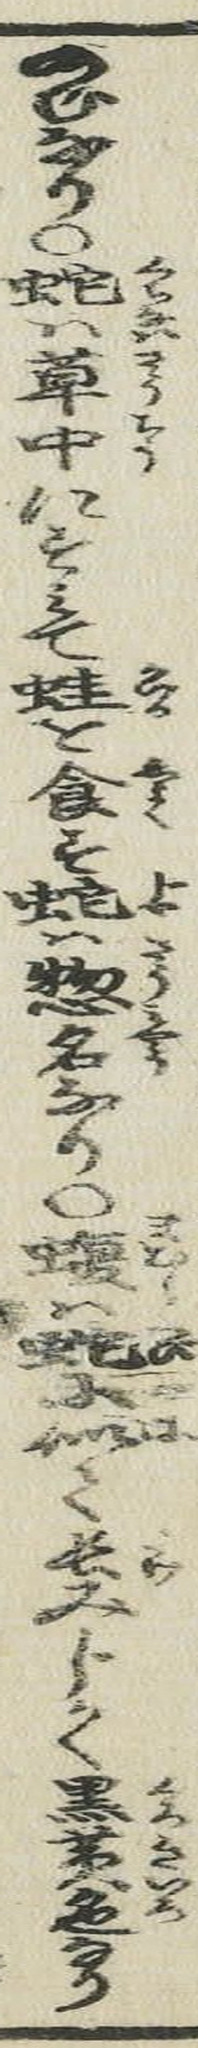のむなり○蛇は草中にすみて蛙を食す蛇は惣名なり○蝮は蛇に似て長みじかく黒黄色なり
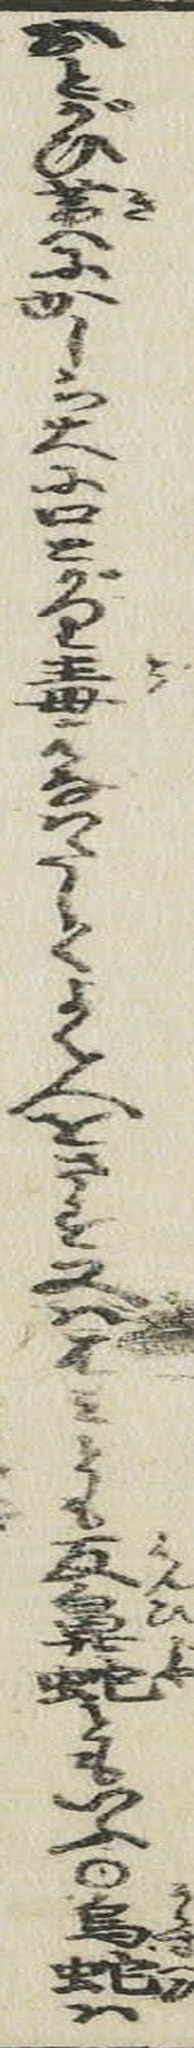おとがひ黄にかしら大に口とがり毒はなはたしくよく人をさす又ははみとも反鼻蛇ともいふ○烏蛇は
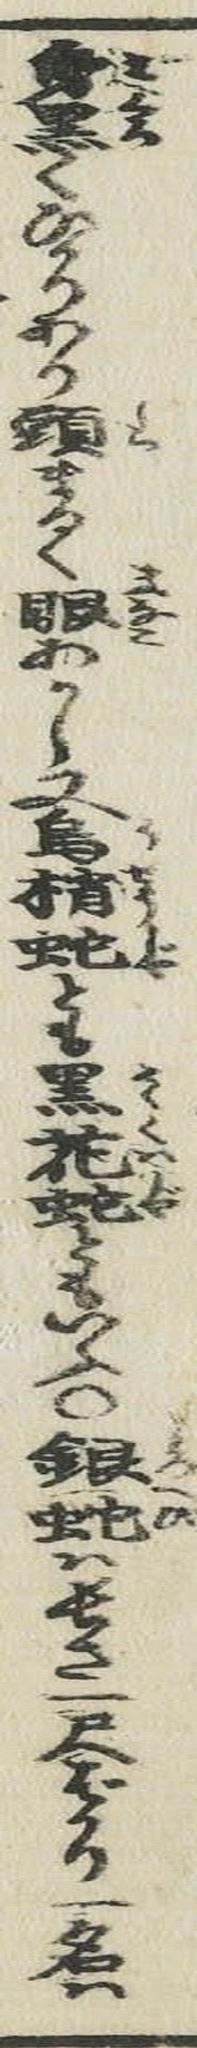身黒くひかりあり頭まるく眼あかし又烏梢蛇とも黒花蛇ともいふ○銀蛇は長さ一尺ばかり一名は
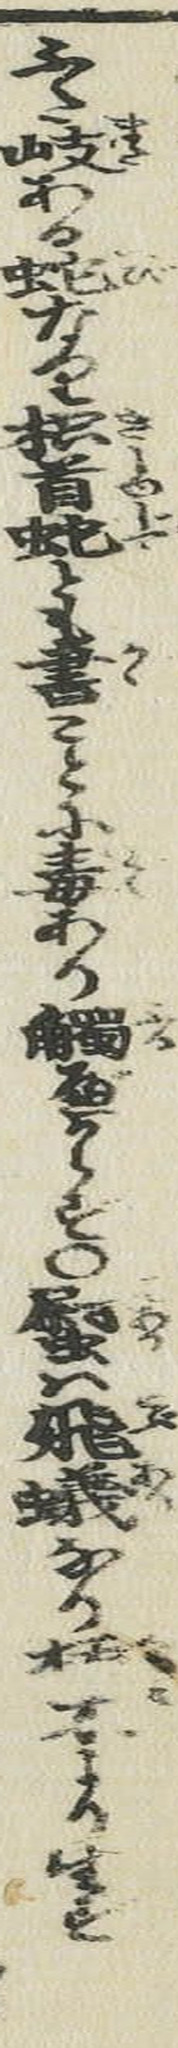ふた岐ある蛇なり枳首蛇とも書ことに毒あり触べからず○螱は飛蟻なり朽木より生ず
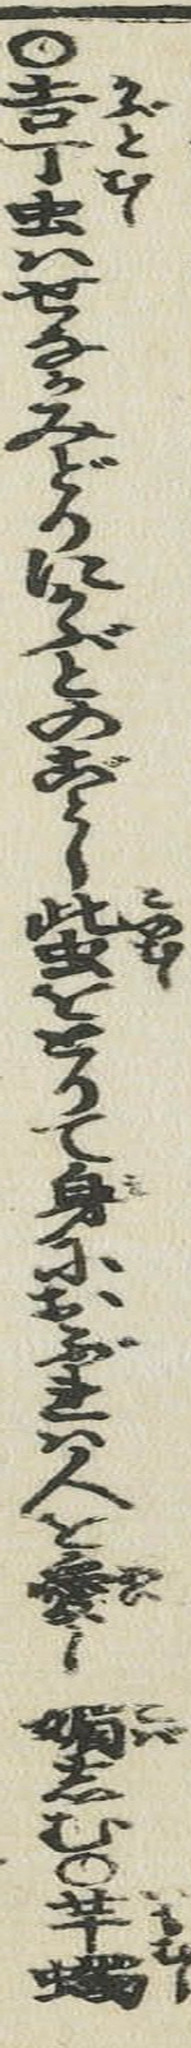○吉丁虫はせなかみどりにかぶとのごとし此虫をとりて身におぶれは人を愛し媚しむ○芋蠋
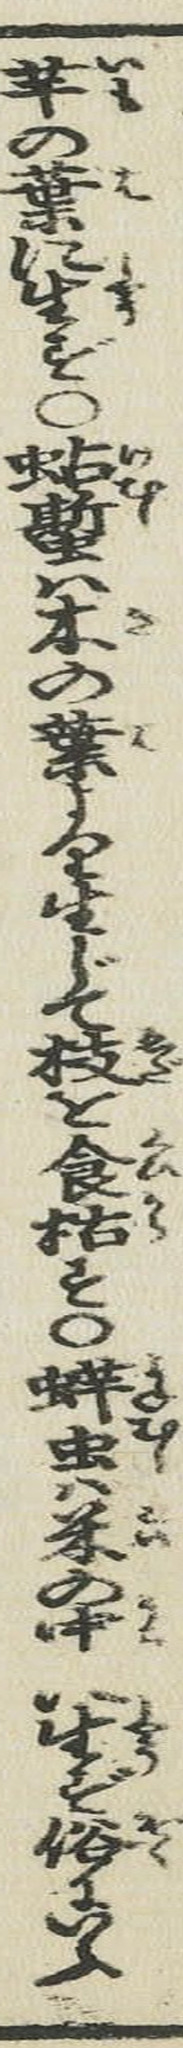芋の葉に生ず○蛅蟖は木の葉より生じて枝を食枯す○𧋪虫は米の中に生ず俗にいふ
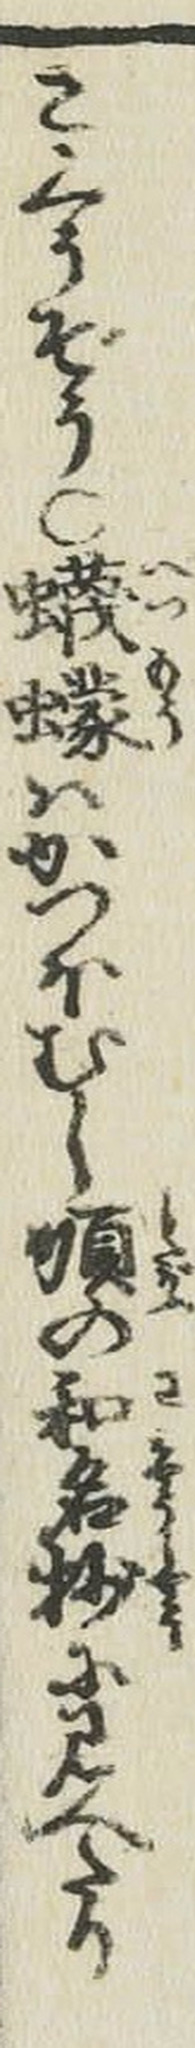こくうぞう○蠛蠓はかつほむし順の和名抄に見へたり
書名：増補頭書訓蒙図彙大成 10巻 7:巻之14-16
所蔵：東京学芸大学教育コンテンツアーカイブ
